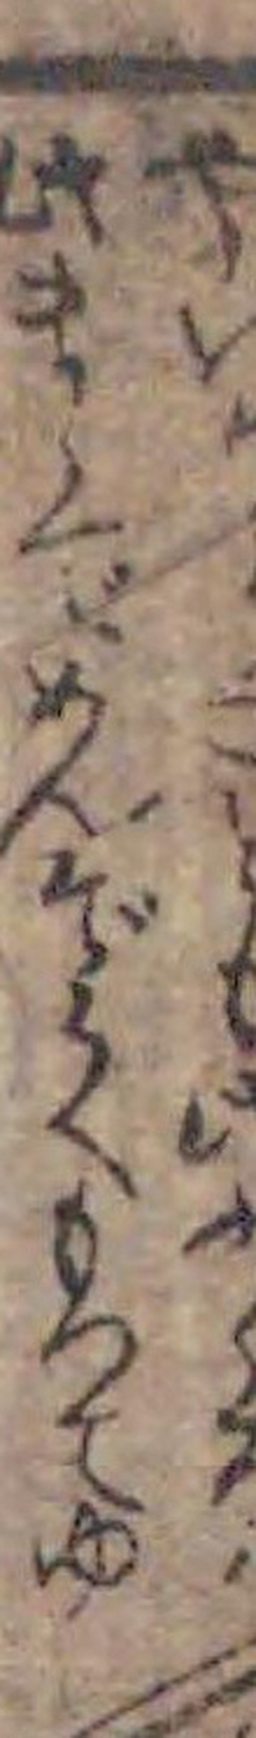此まゝでめんぞうへもつてゆ
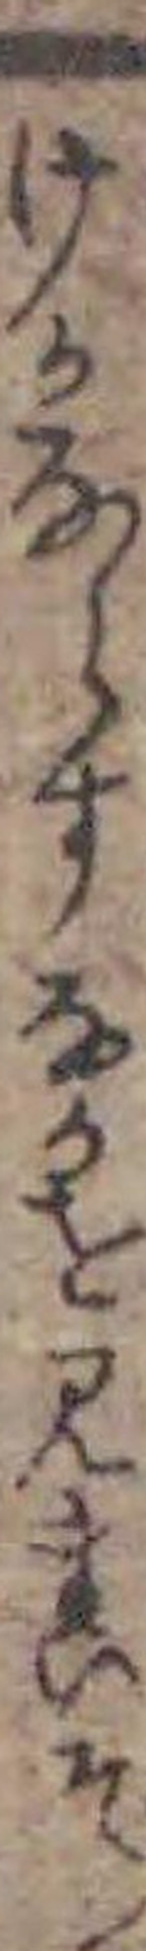けかならすなかを見まいぞ
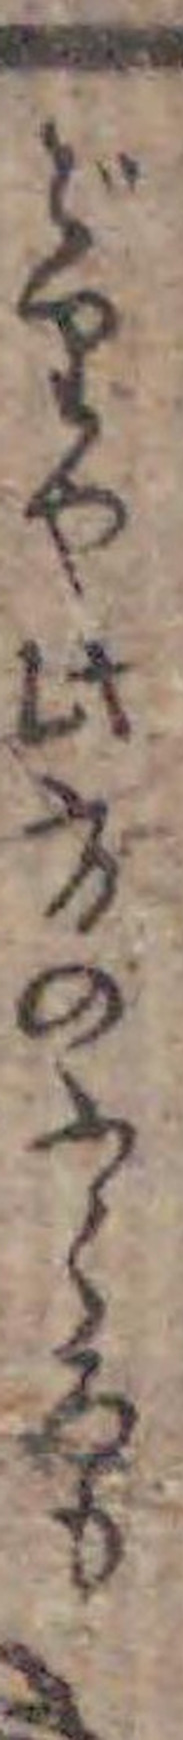どりや此方のふくろも
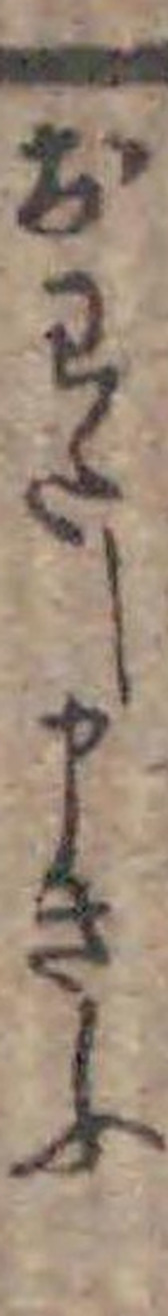おわたし申きふ
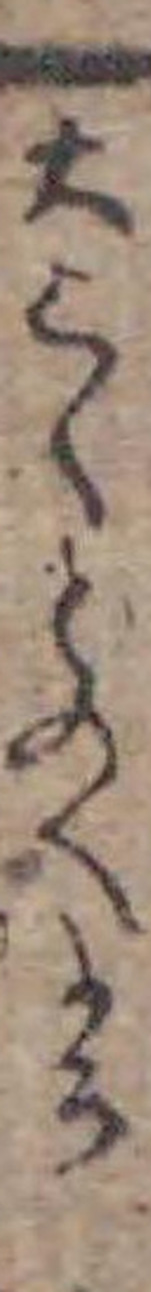大こくとのへよろ
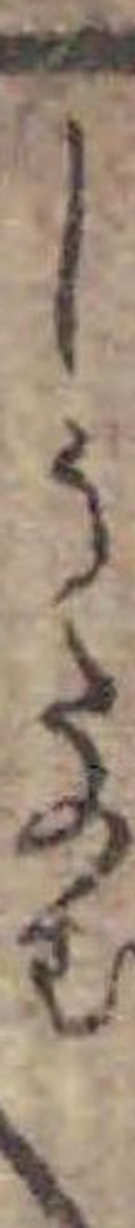しうたのむ
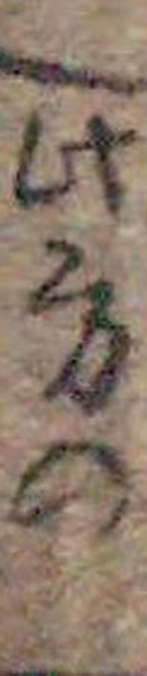此方の
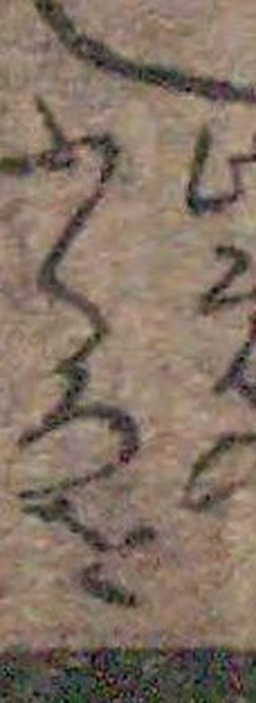ふくろを
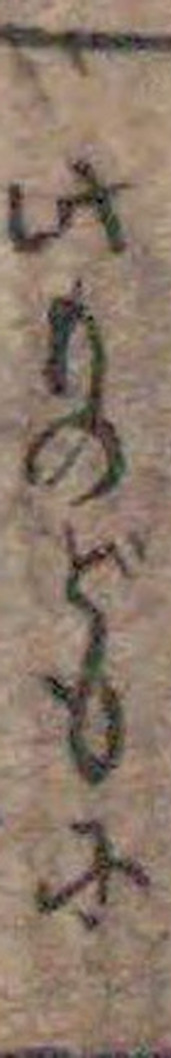此ものどもに
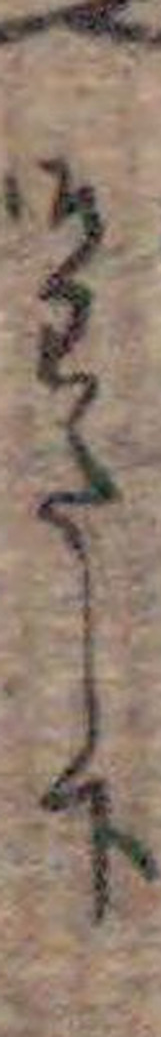御わたし下
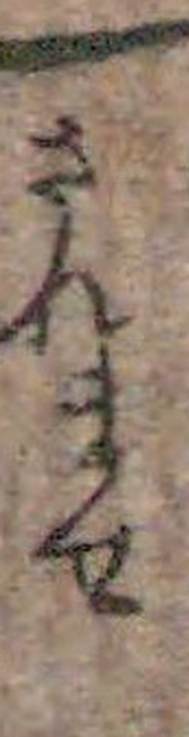されませ
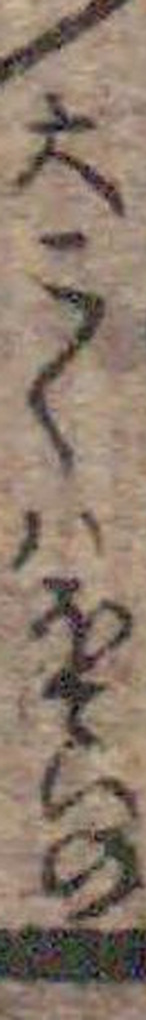大こくはほていの
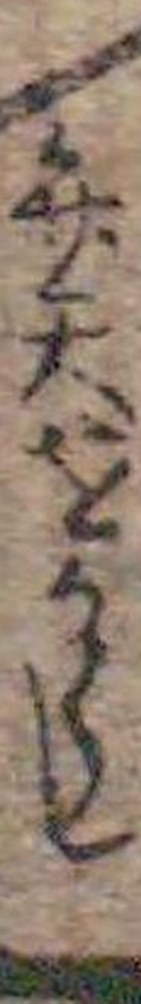弁天をかくし
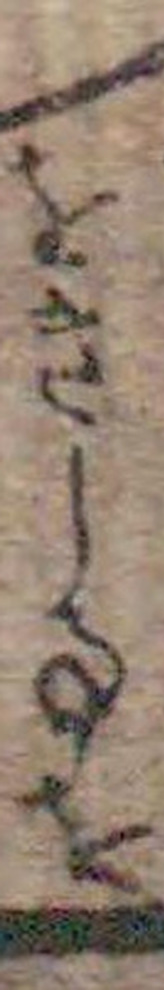をきし事を
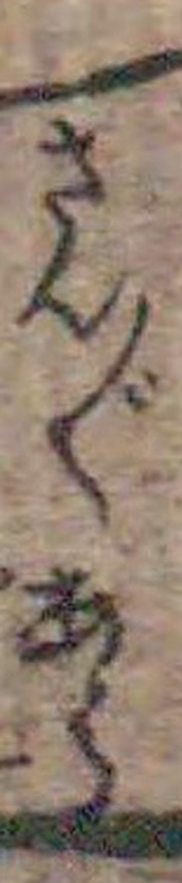さん〴〵あく
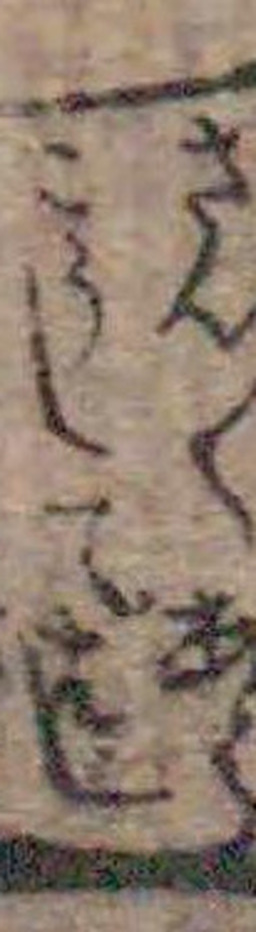こうしてはじ
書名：蛭子大黒壮年過 : 2巻
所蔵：国立国会図書館 National Diet Library, JAPAN
